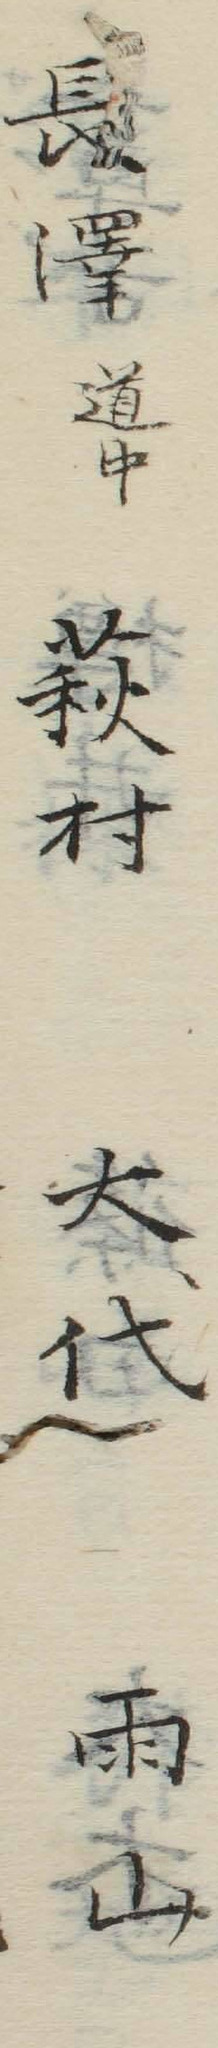長澤道中萩村大代雨山

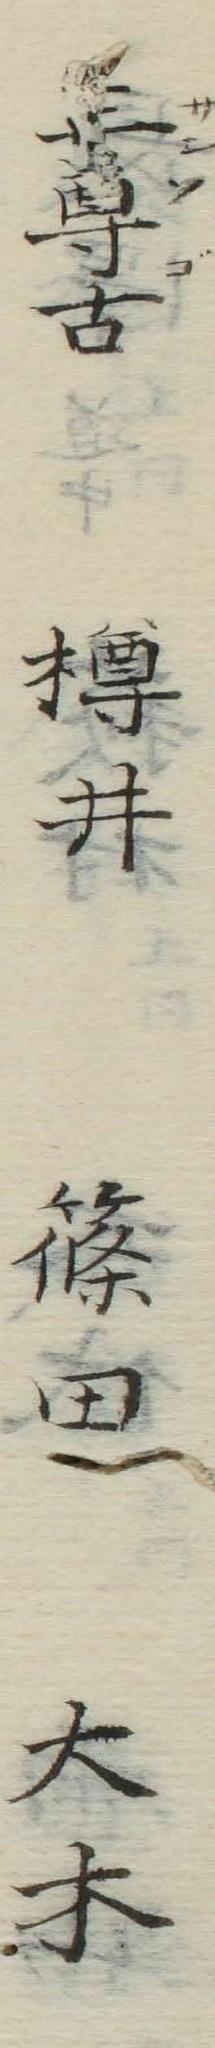三尊古樽井篠田大木
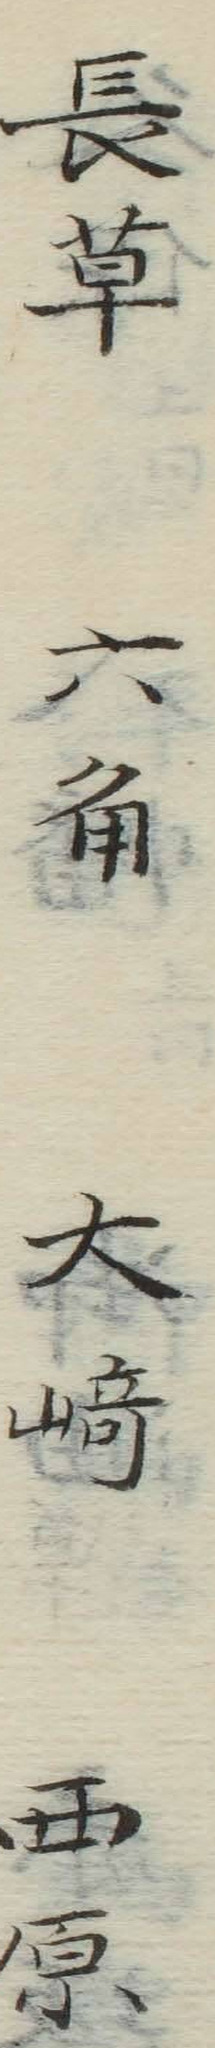長草六角大崎西原
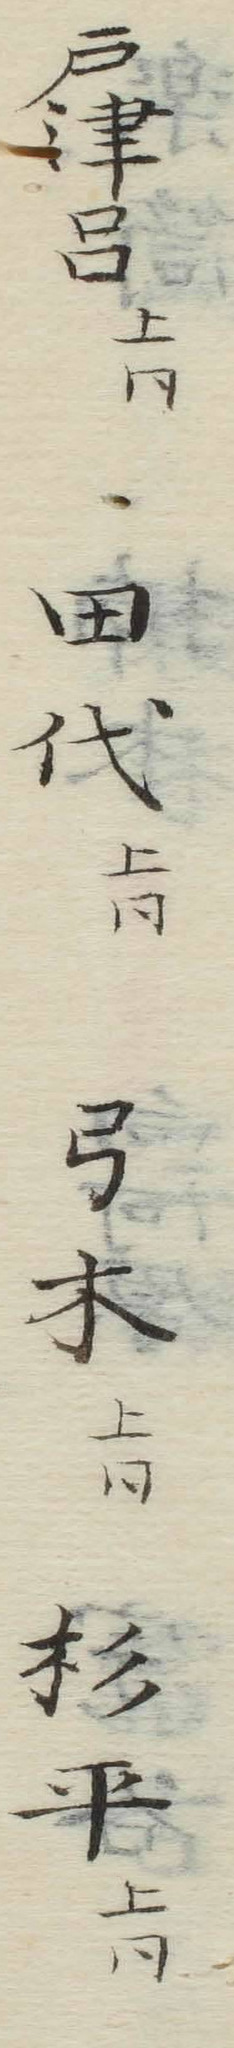戸津呂上同田代上同弓木上同杉平上同
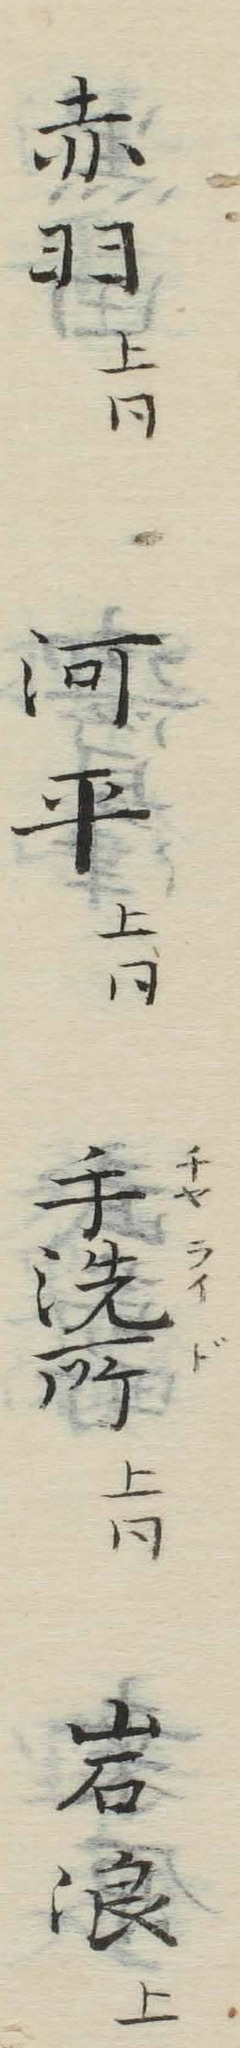赤羽上同河平上同手洗所上同岩浪上同
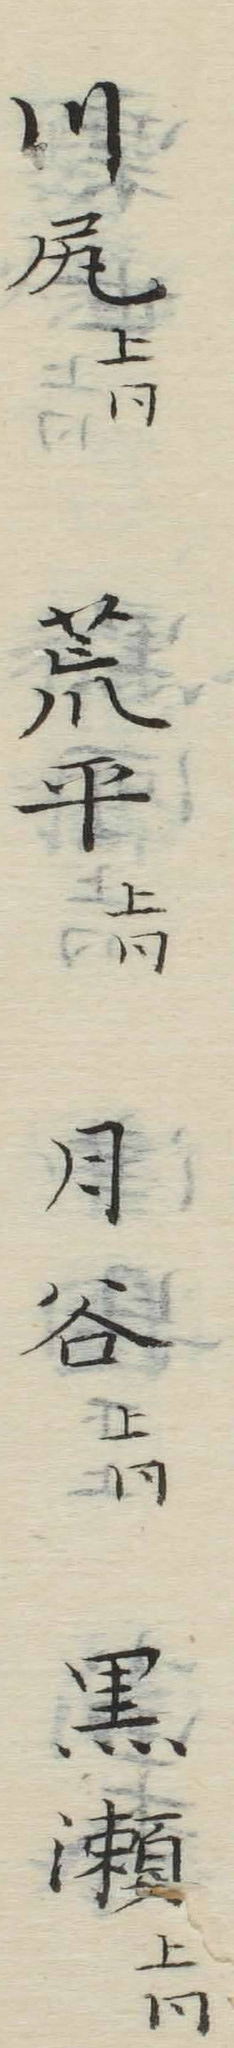川尻上同荒平上同月谷上同黒瀬上同
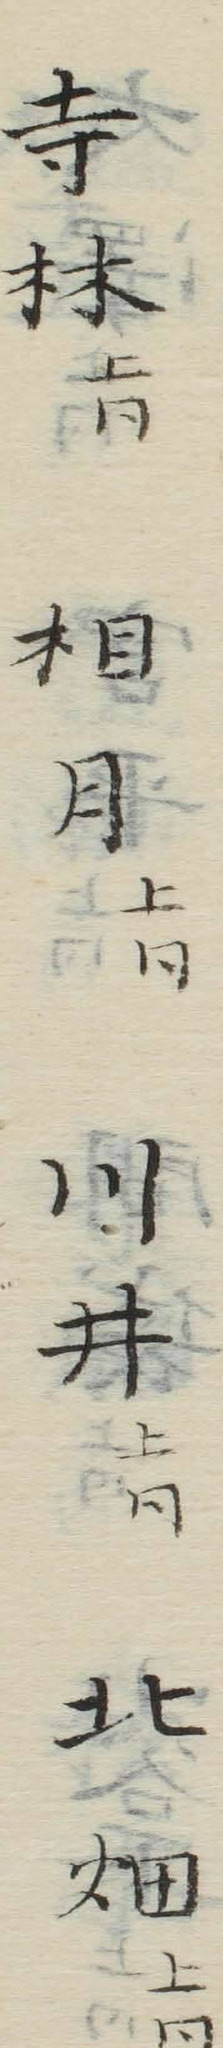寺林上同相月上同川井上同北畑上同
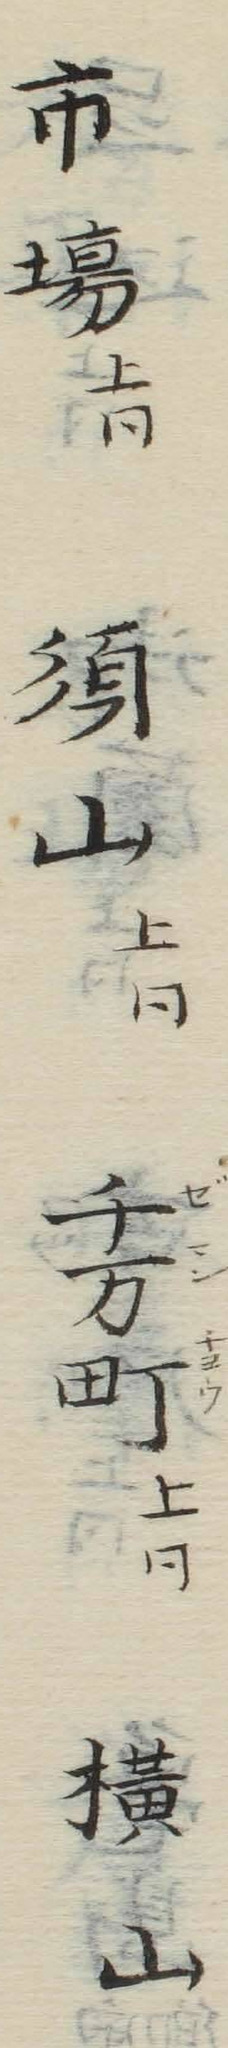市場上同須山上同千万町上同横山
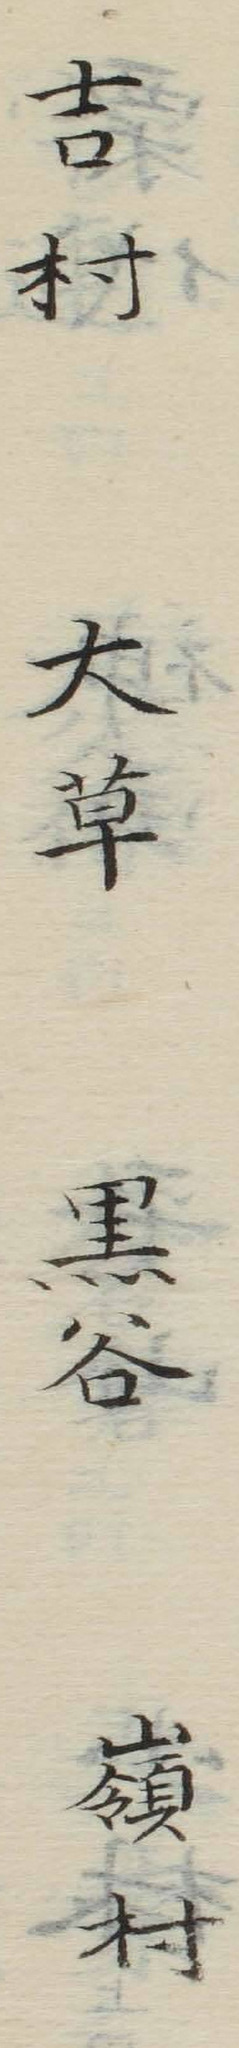吉村大草黒谷嶺村
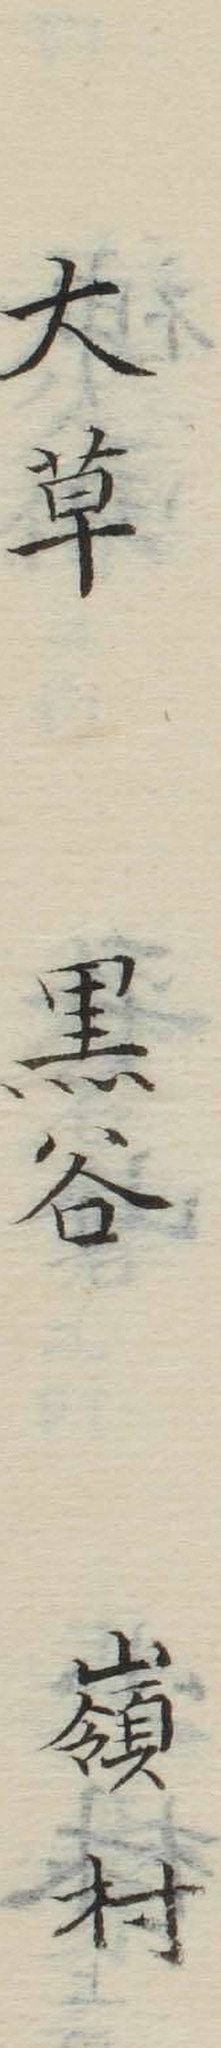吉村大草黒谷嶺村
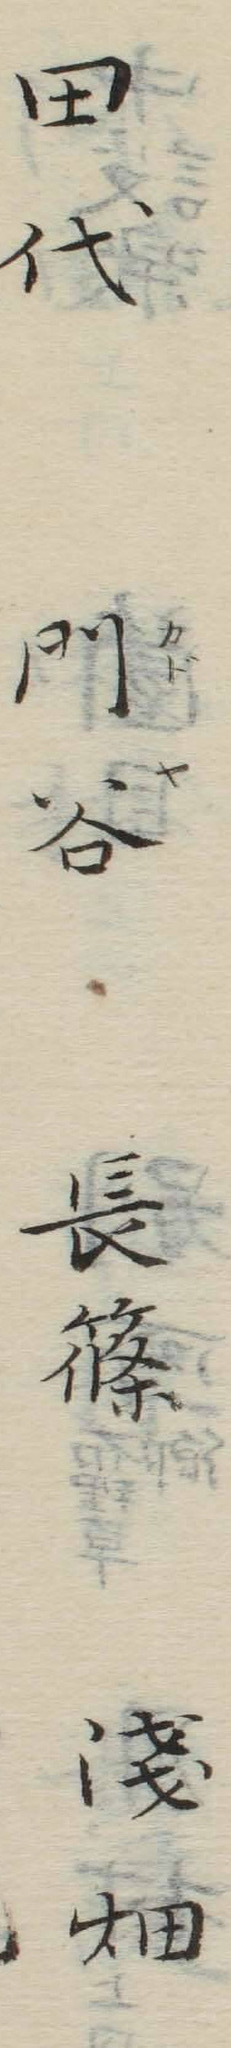田代門谷長篠淺畑

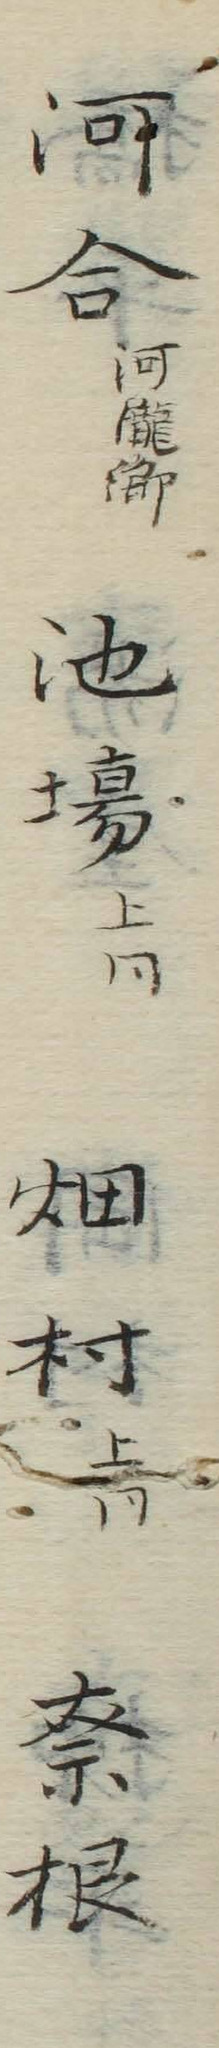河合河瀧郷池場上同畑村上同奈根
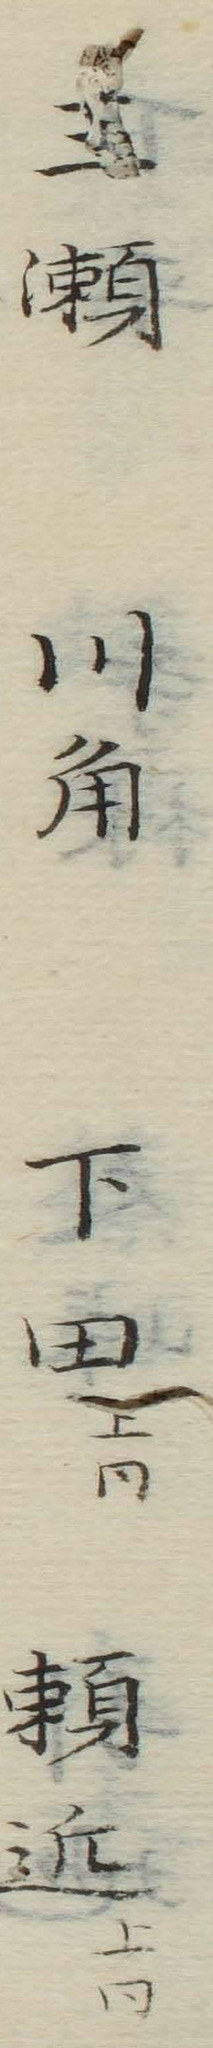瀬川角下田上同頼近上同
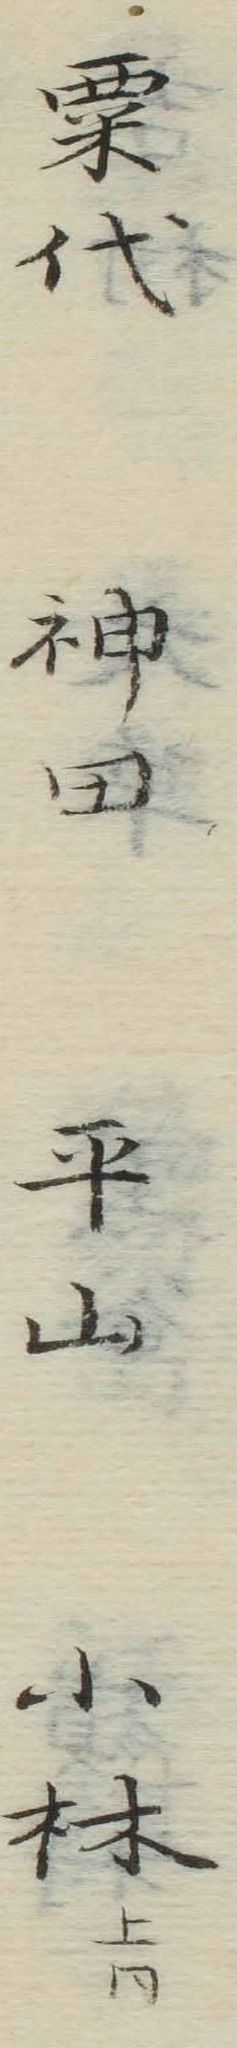粟代神田平山小林上同
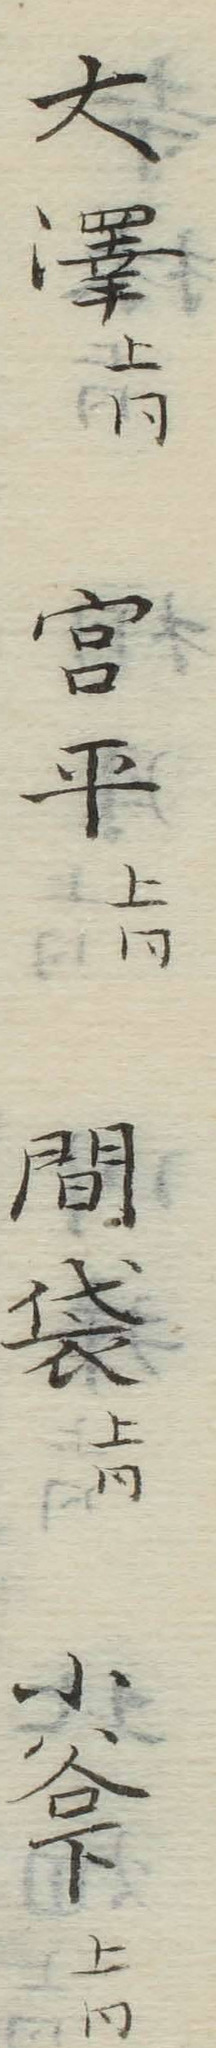大澤上同宮平上同間袋上同小谷下上同
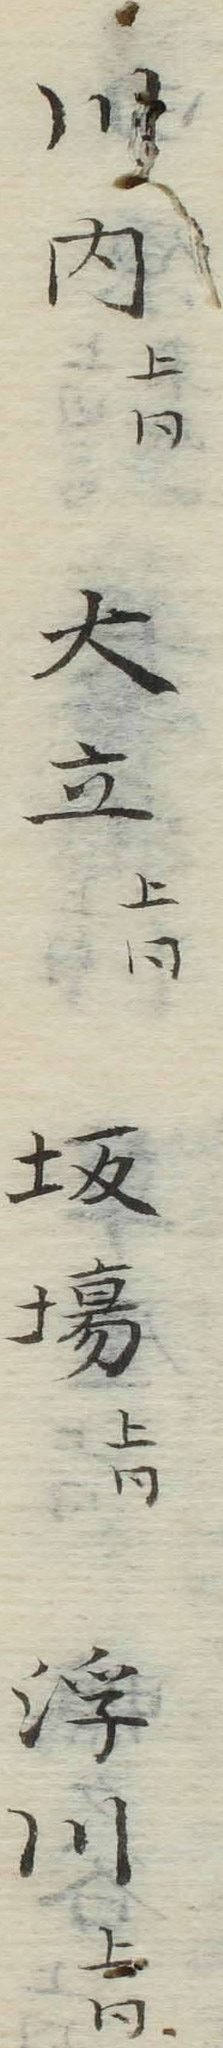川内上同大立上同板場上同浮川上同
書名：三河国二葉松
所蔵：国文学研究資料館
